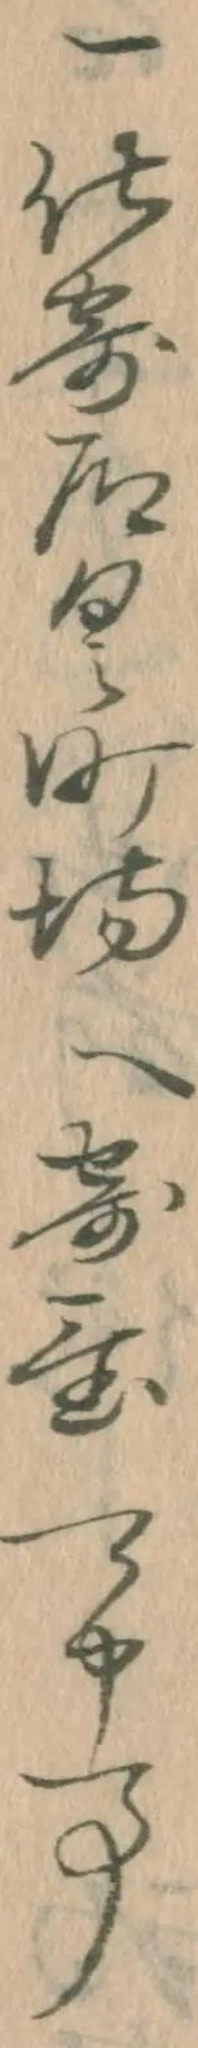一仕寄道具町場へ寄置可申事
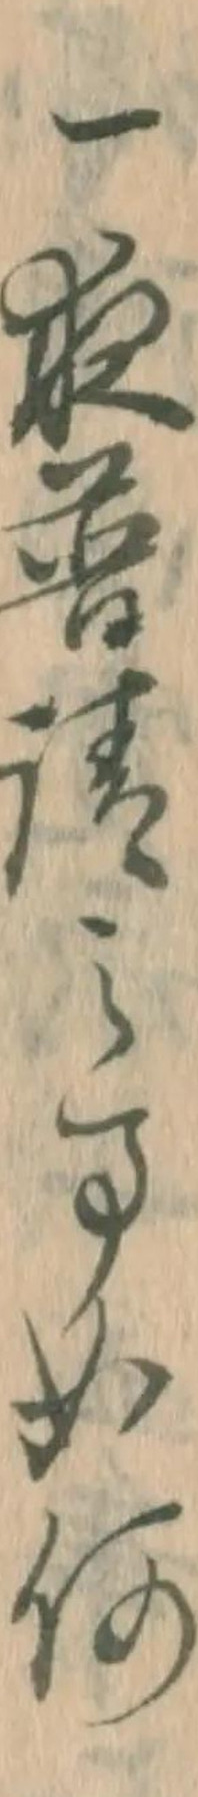一夜普請之事如何
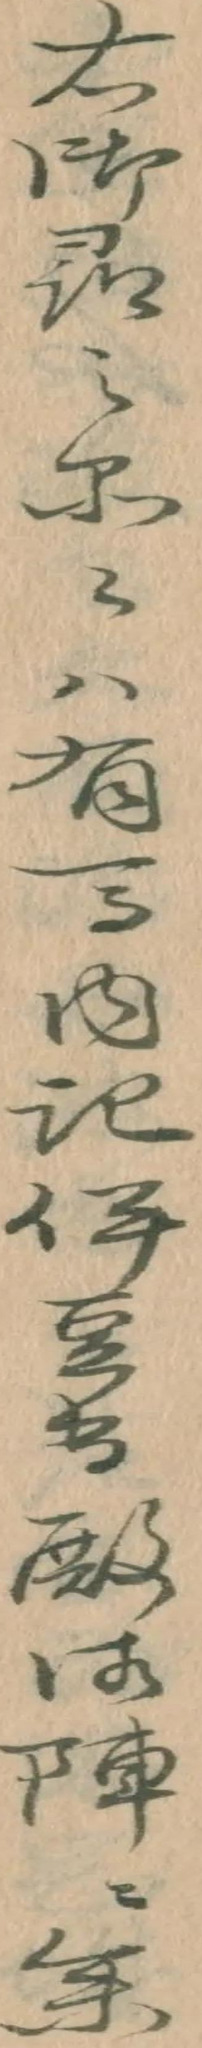右御尋之品々は有馬内記伊豆守殿御陣に参
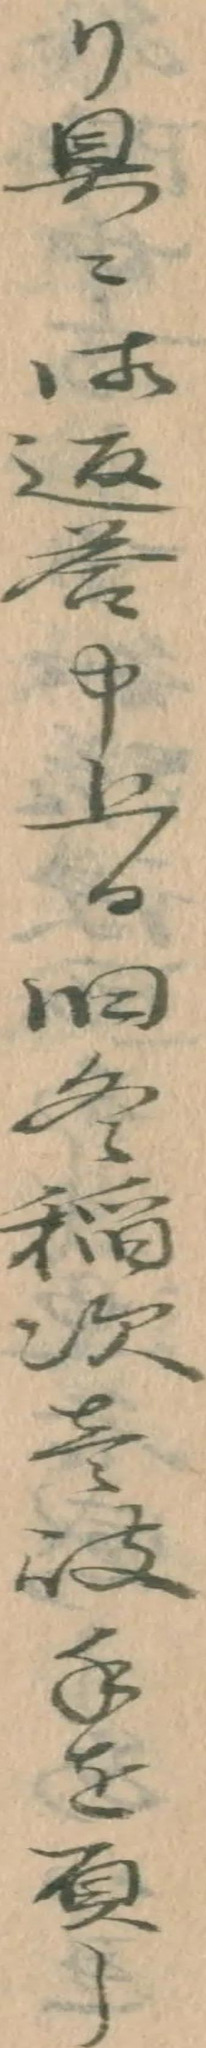り具に御返答申上る旧冬稲次壱岐手を負し
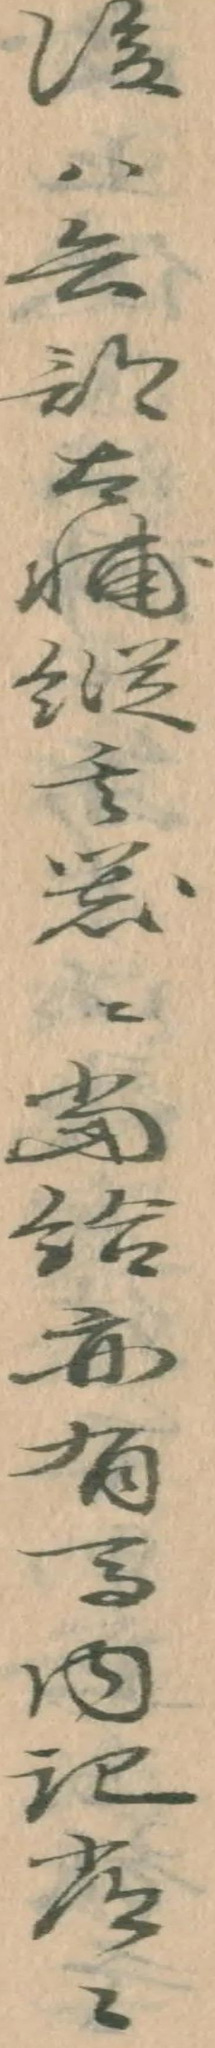後は兵部太輔縦其器に当給亦有馬内記常々
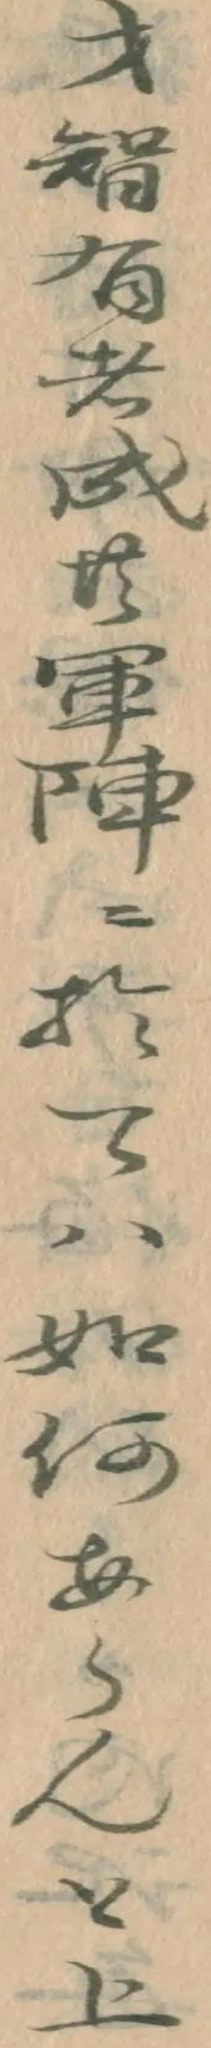才智有者成共軍陣に於ては如何あらんと上

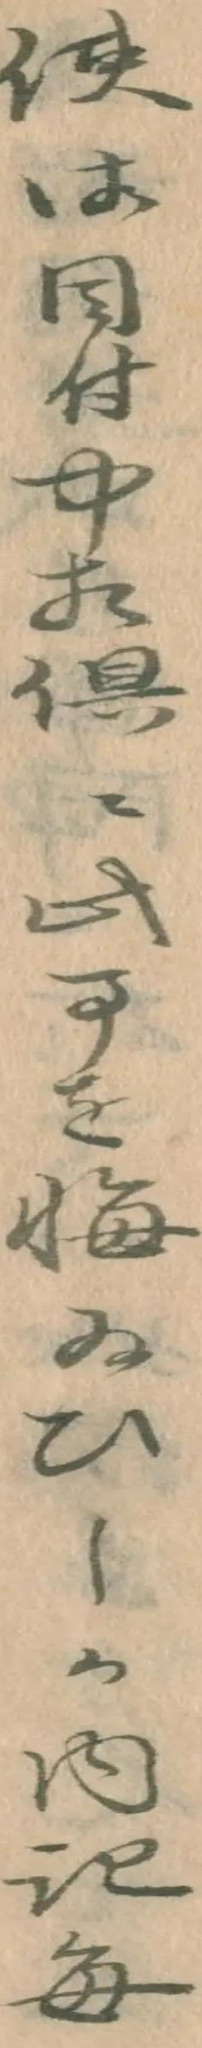使御目付中相俱に此事を悔ゐひしか内記毎
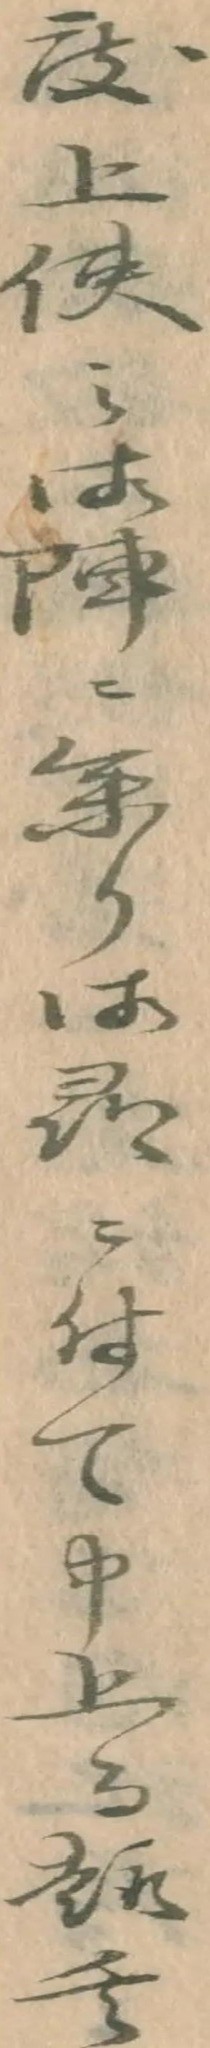度上使之御陣に参り御尋に付て申上る趣其
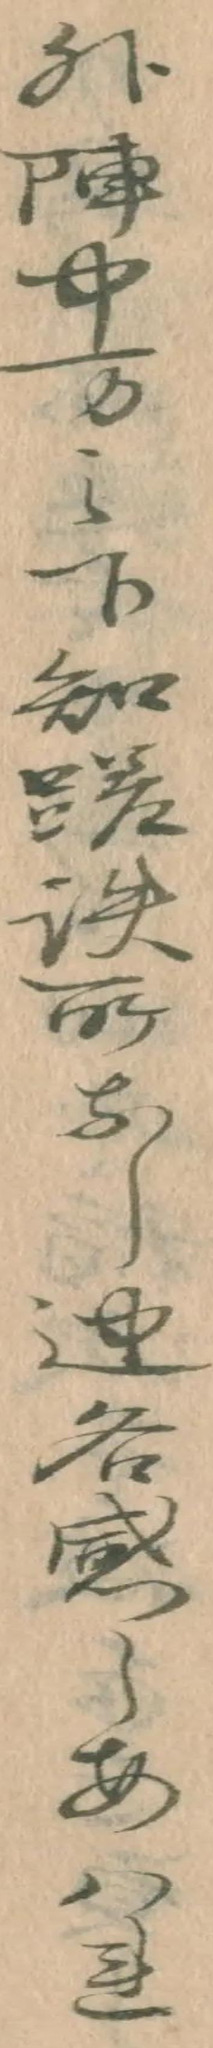外陣中方之下知蹉鉄所なし迚各感しあは連
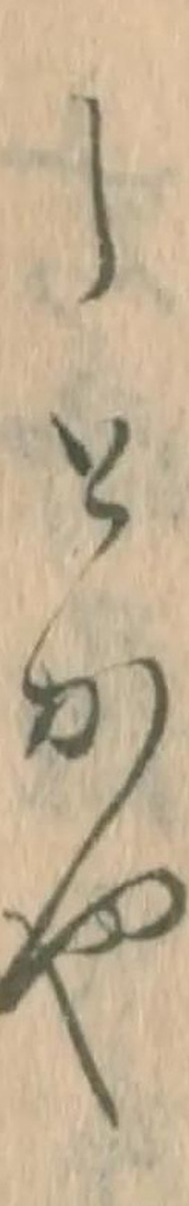しとかや
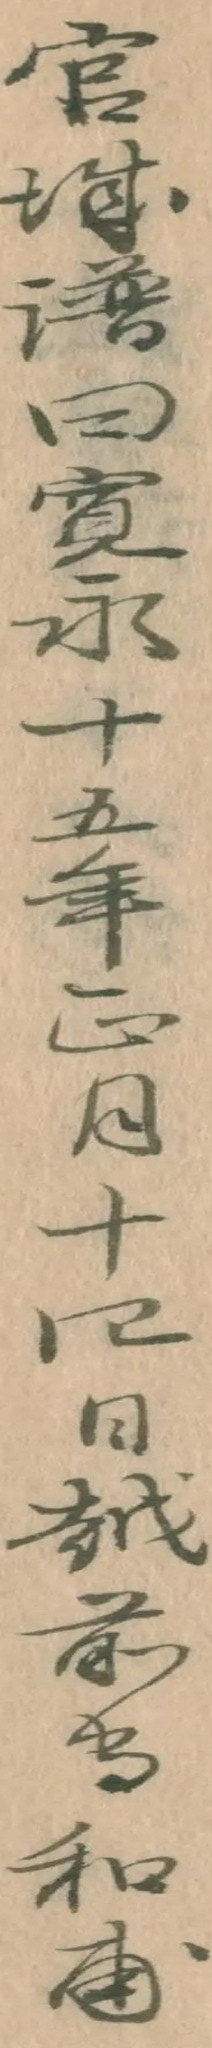宮城譜曰寛永十五年正月十四日越前守和甫
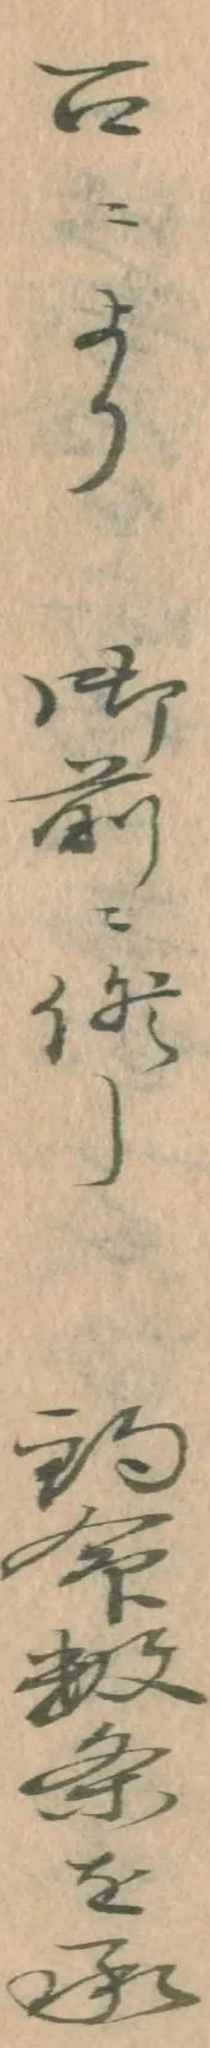召により御前に候し釣命数条を承
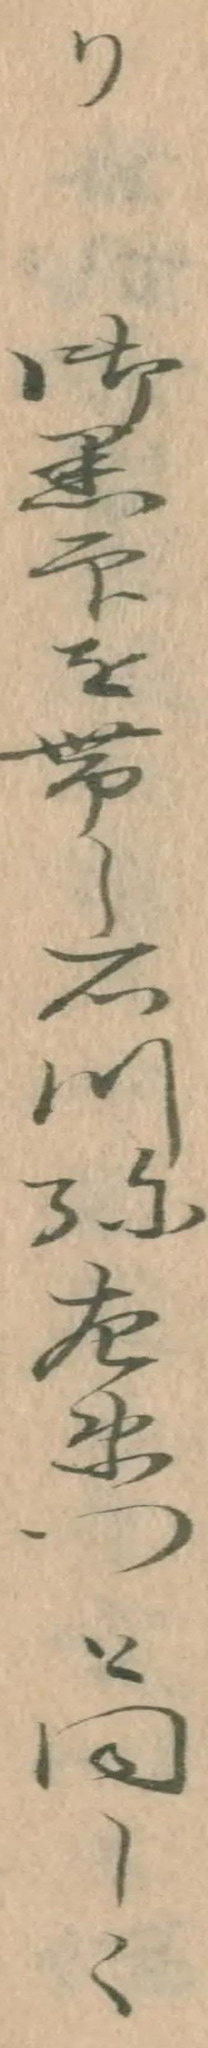り御黒印を帯し石川弥左衛門と同じく
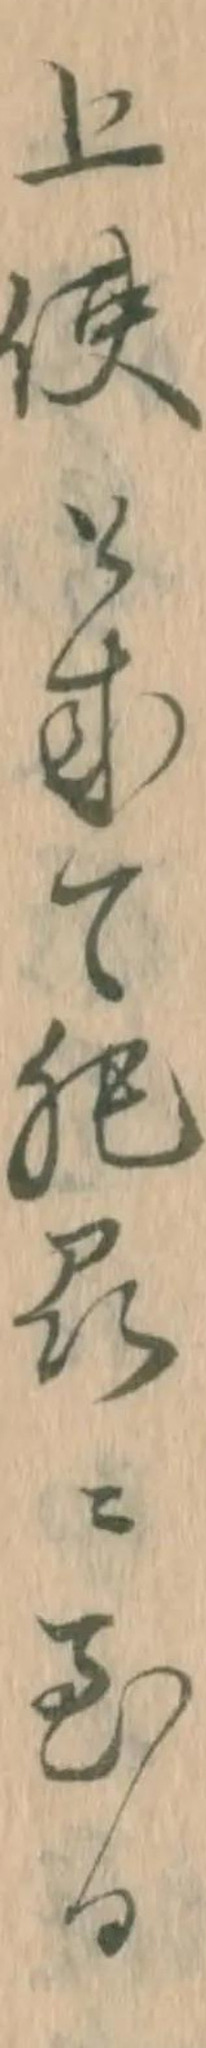上使と成て肥州に至る
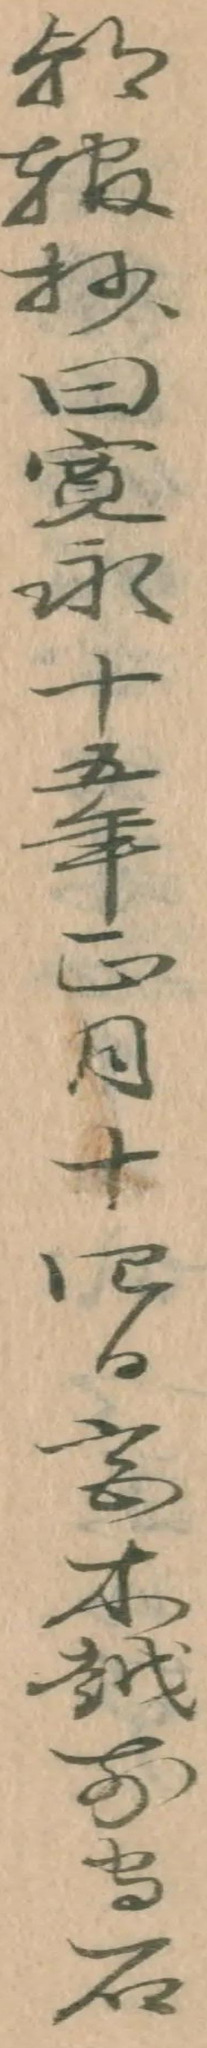朝報抄曰寛永十五年正月十四日高木越前守石
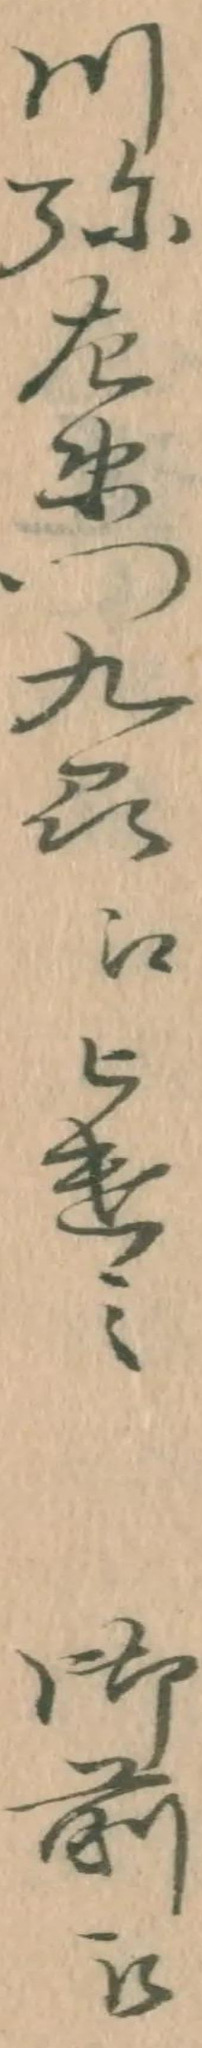川弥左衛門九州江被遣之御前被
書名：切支丹御退治記 49巻. [6]
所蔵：国立国会図書館 National Diet Library, JAPAN
